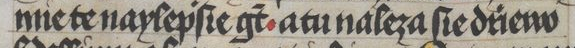zemie te naylepẛie ḡt.atu naleza ſie dřiewo
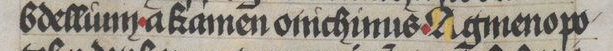bdellium.a kamen onichinus. Ale gmeno po¬
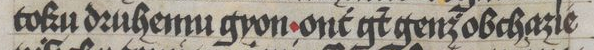toku druhemu gyon.ont ḡt genż obchazíe
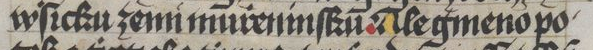wẛícku zemí muṙenínſku.Ale gmeno po¬
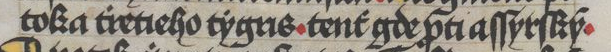toka tṙetieho tygris.tenṫ gde ꝓti aſſyrſkȳ.
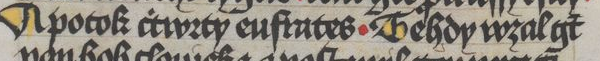A potok ċtwrty eufrates.Tehdy wzal ḡt
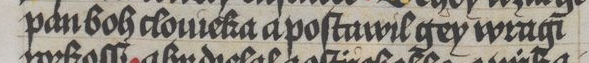pan boh clouieka a poſtawil gey wragi
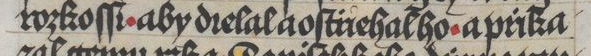rozkoſſi.aby dielal a oſtṙiehal ho.a pṙika¬
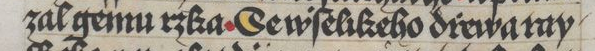zal gemu rzka.Se wẛelikeho dṙewa ray¬
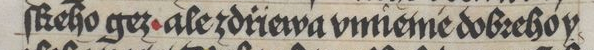keho gez. ale zdṙiewa vmieníe dobreho y
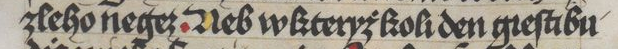zleho negez.Neb wkteryżkoli den gieſtibu¬
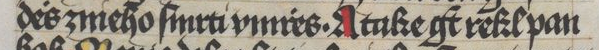deṡ znieho ſmrtí vmṙeš. A take ḡt rekl pan
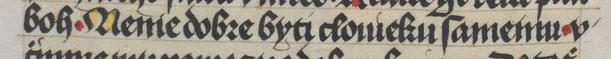boh. Neníe dobre byti clouieku ſamemu.v¬
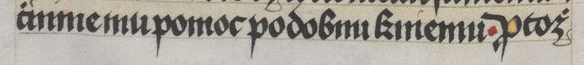ċinine mu pomoc podobnu kniemu.Ꝓtoż
